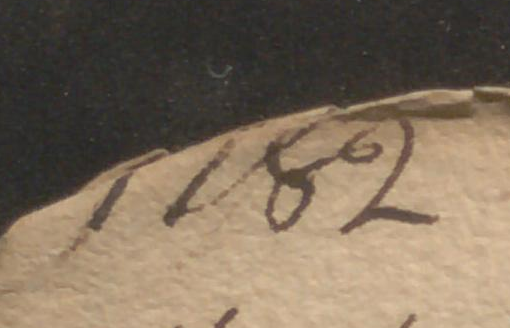1782
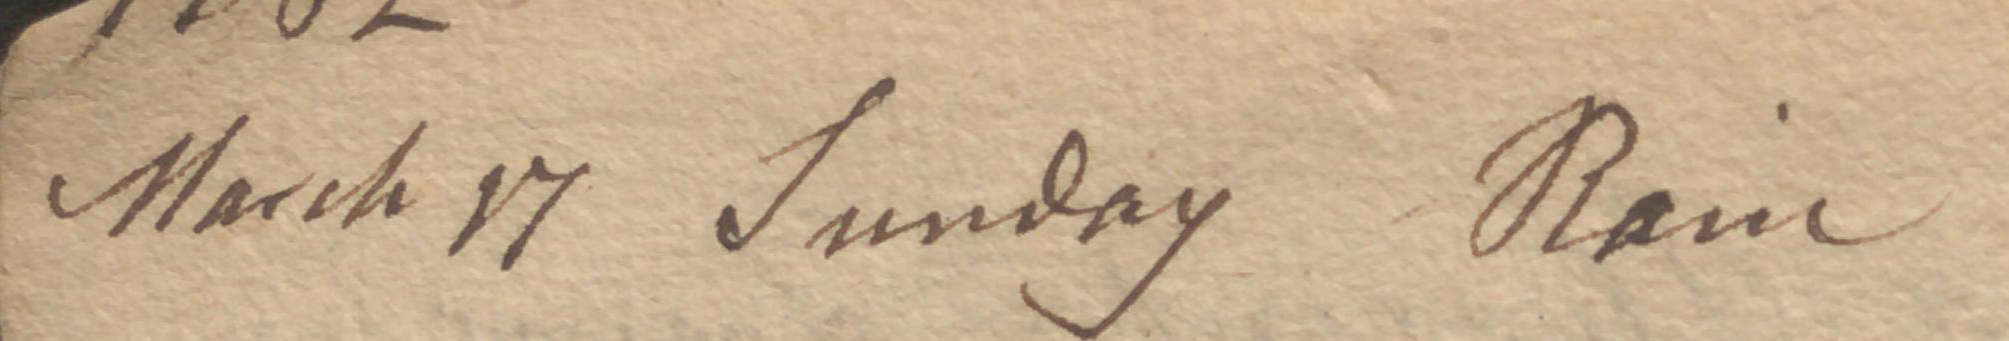March 17 Sunday Rain
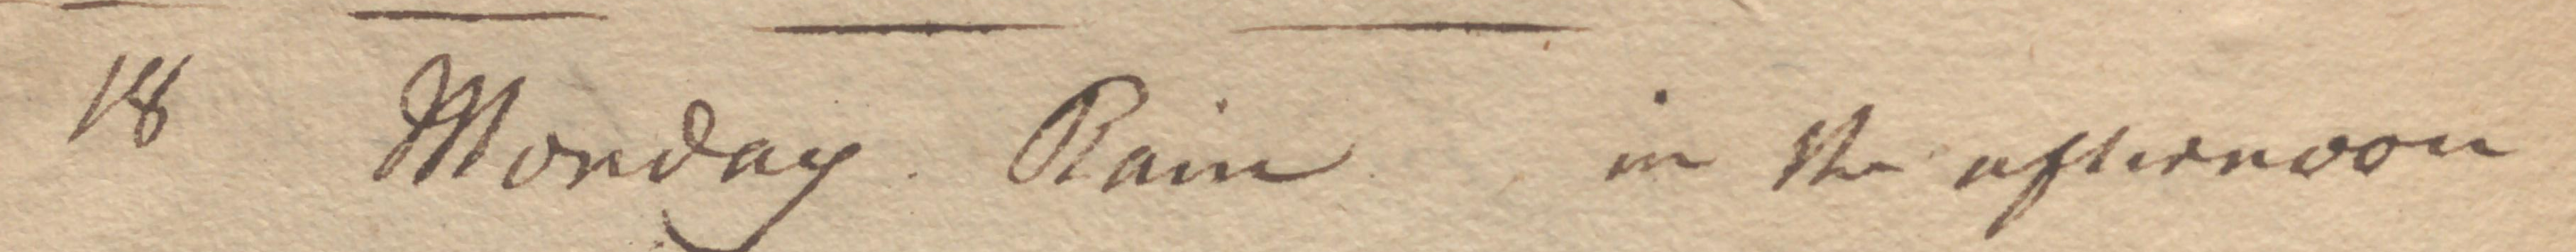18 Monday. Rain in the afternoon
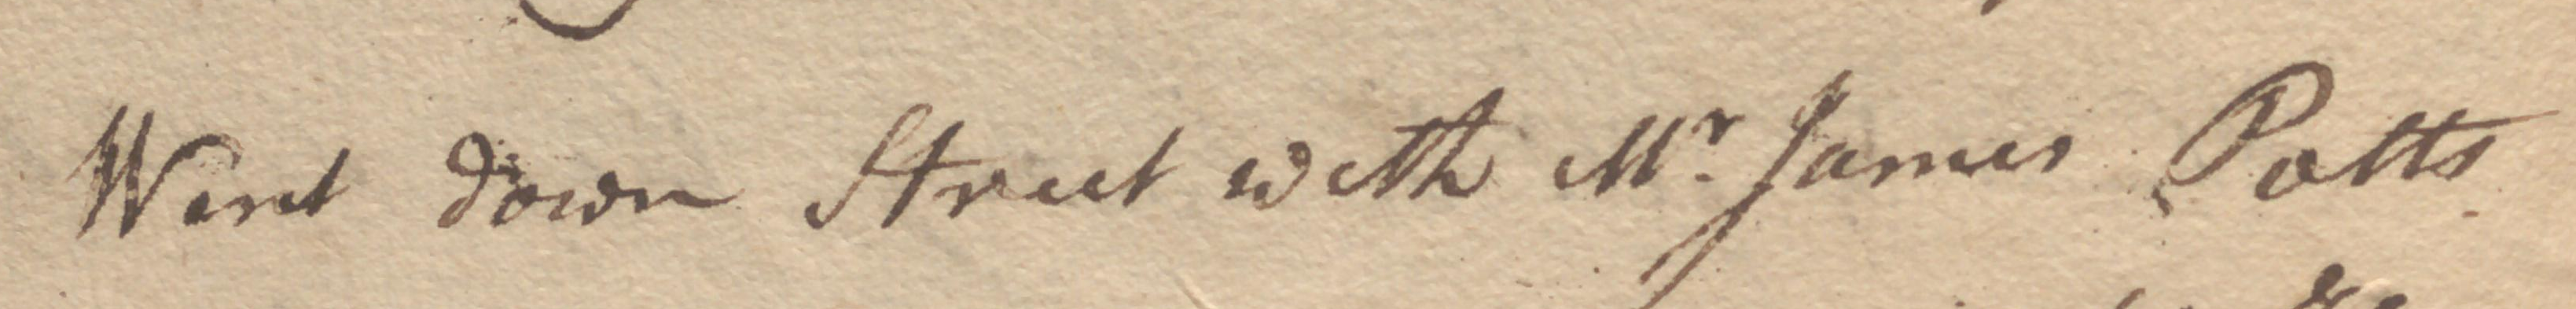Went down Street with M^r. James Potts
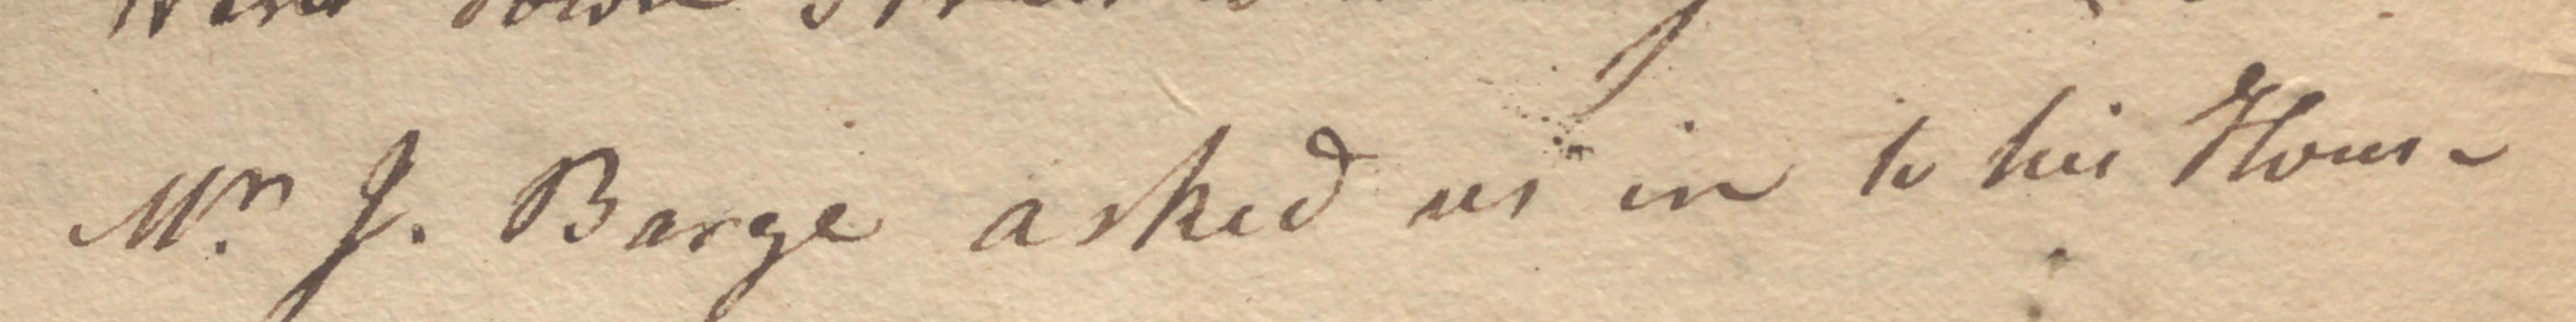M^r. J. Barge asked us in to his House
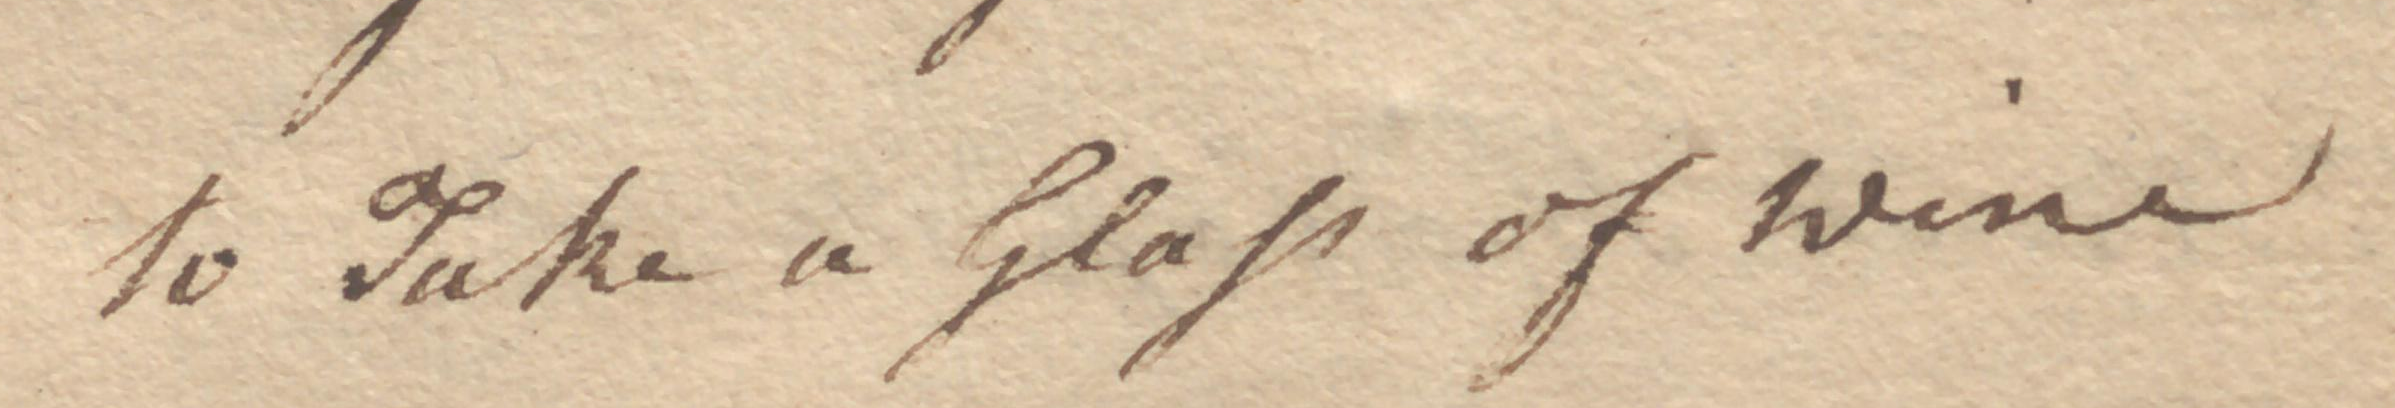to Take a Glass of wine
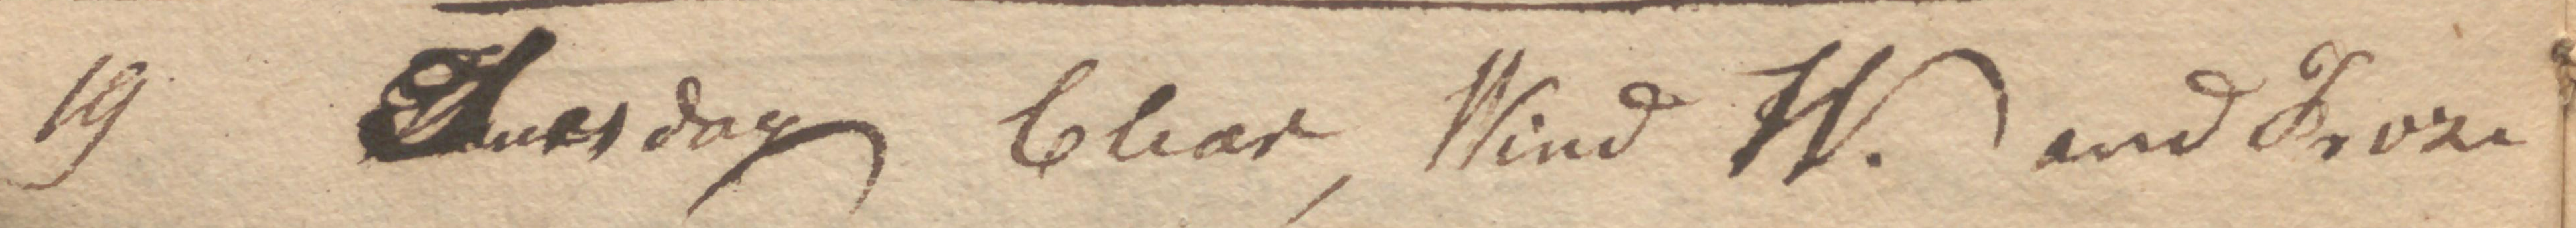19 Thursday Clear Wind W. and Froze
